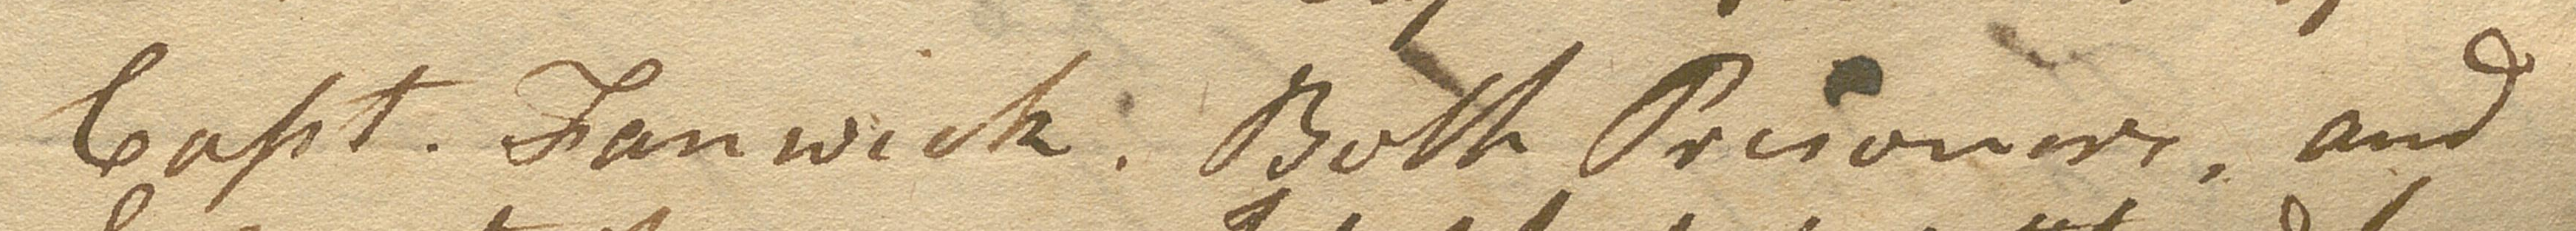Capt. Fanwick. Both Prisoners, and
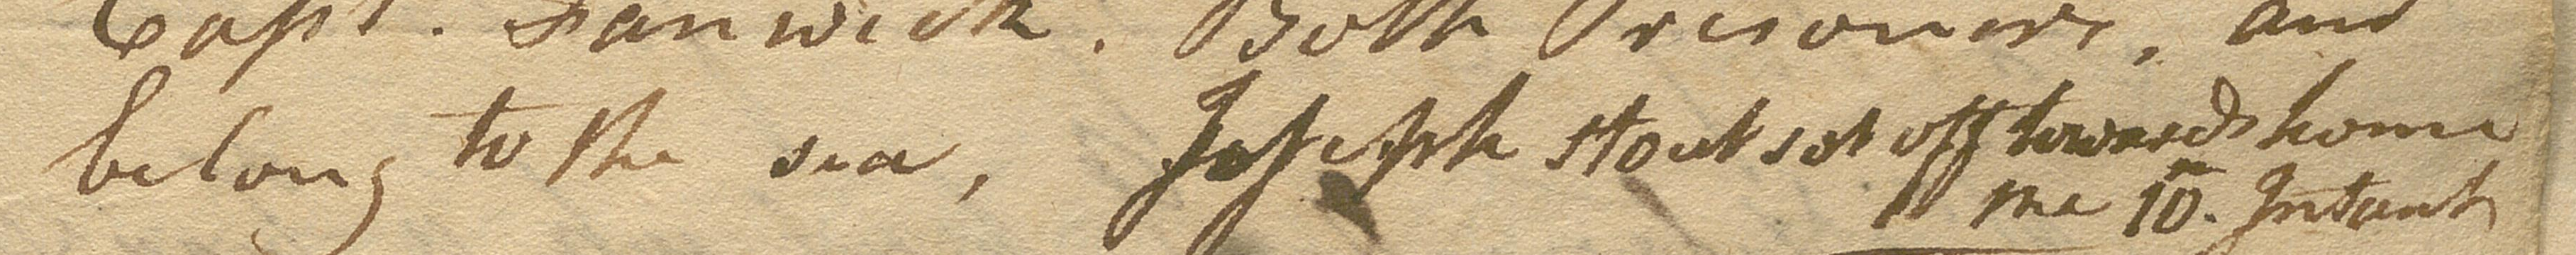belong to the sea, Joseph stout set off towards home
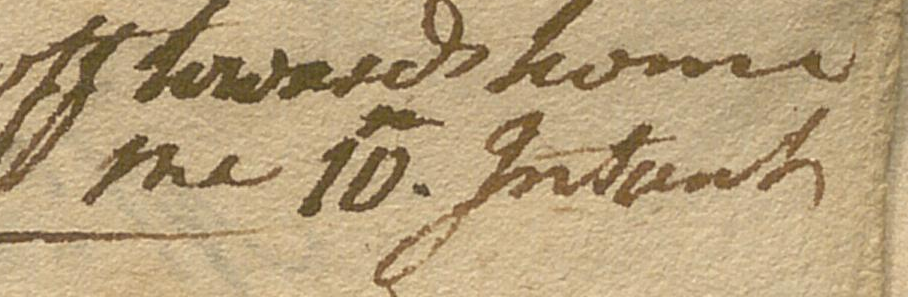the 10^th. Instant
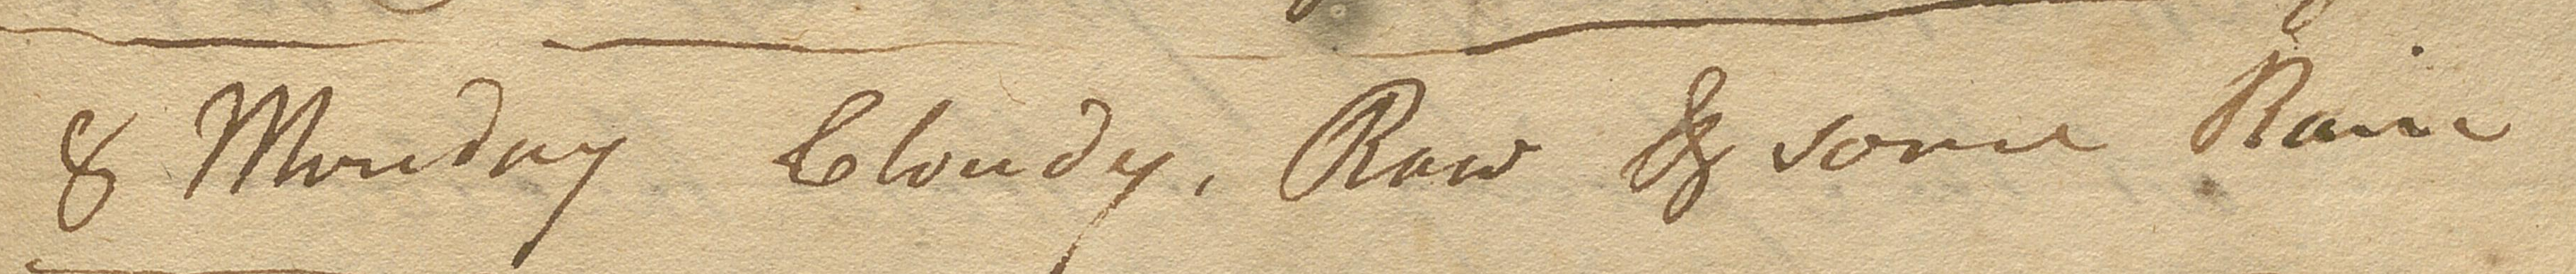8 Monday Cloudy. Raw & some Rain
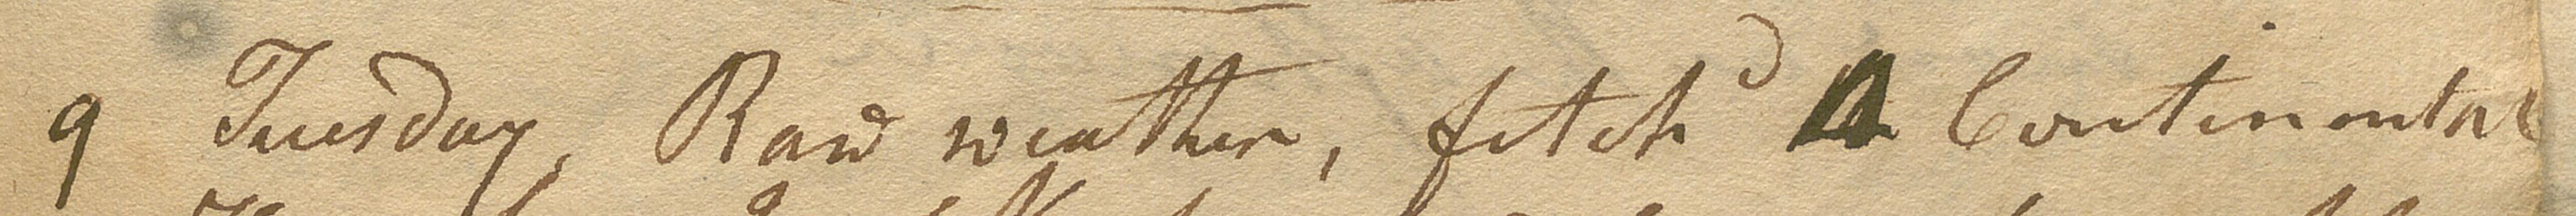9 Tuesday. Raw weather, fetch^d 4 Continental
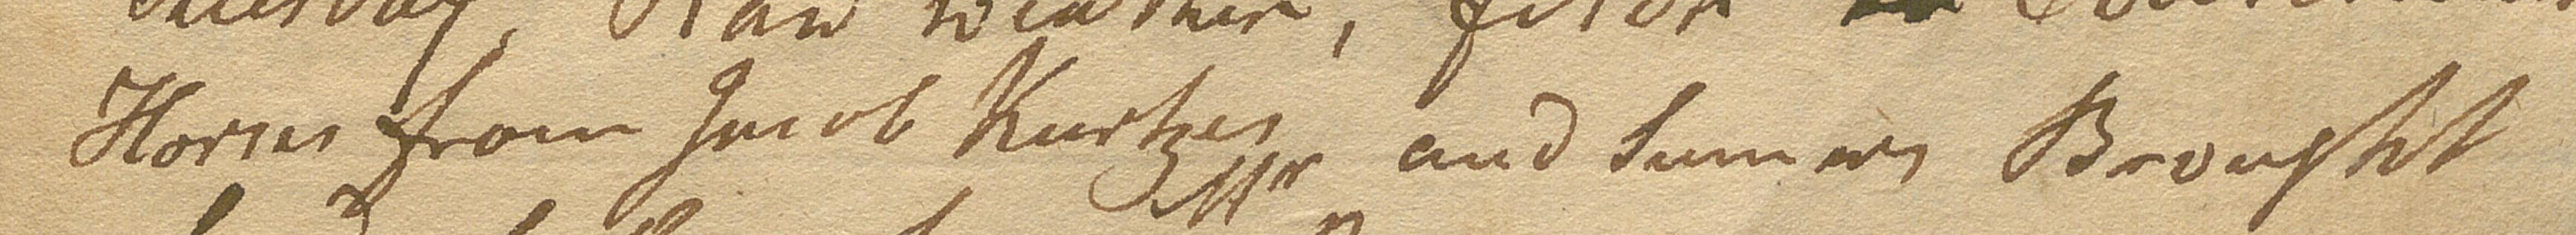Horses from Jacob Kurtzes, and Sumers Brought
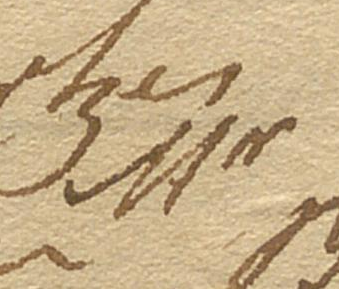M^r
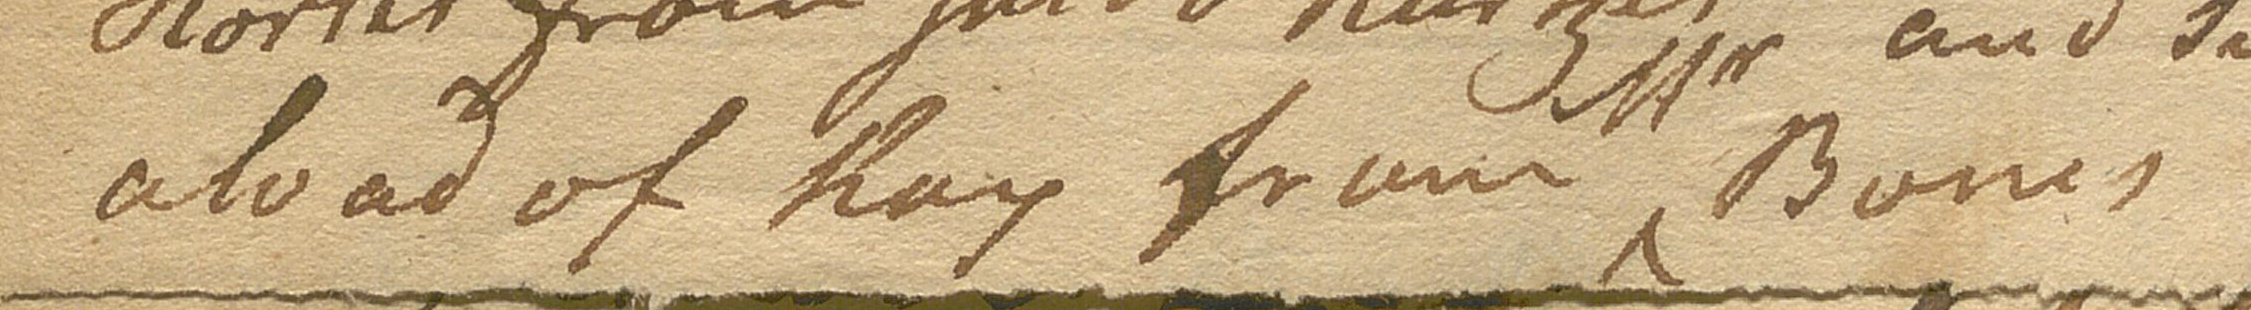a load of hay from ^ Bones
